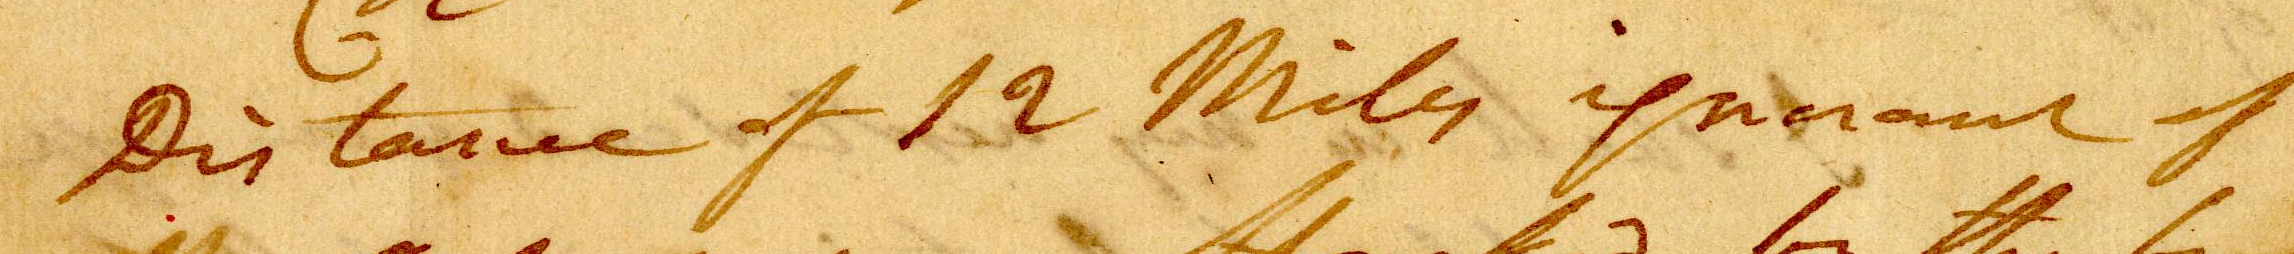Distance of 12 Miles if normal of
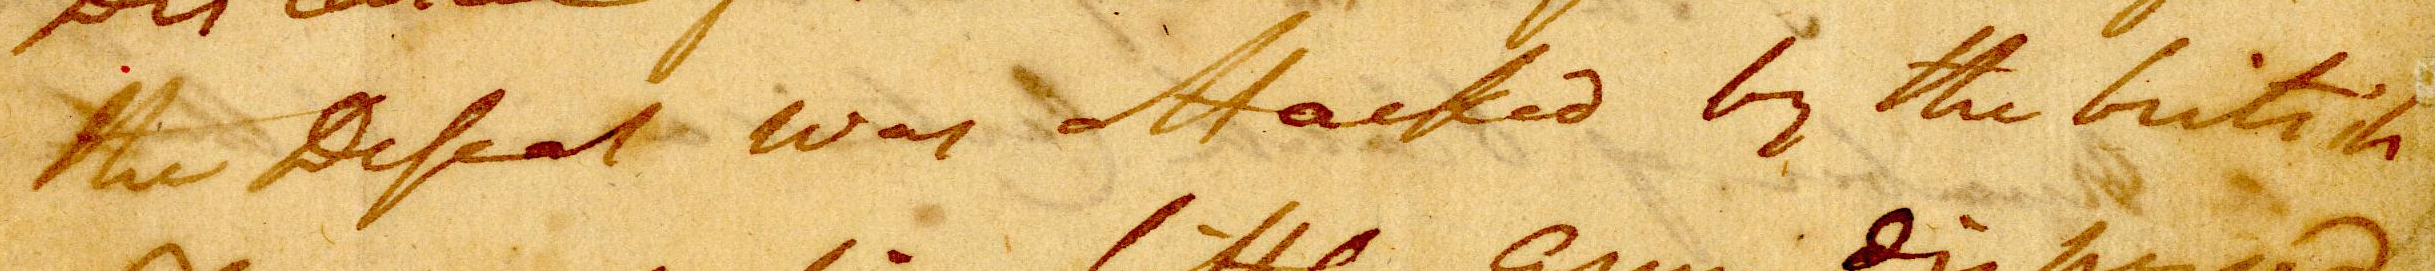the Defeat was attacked by the british
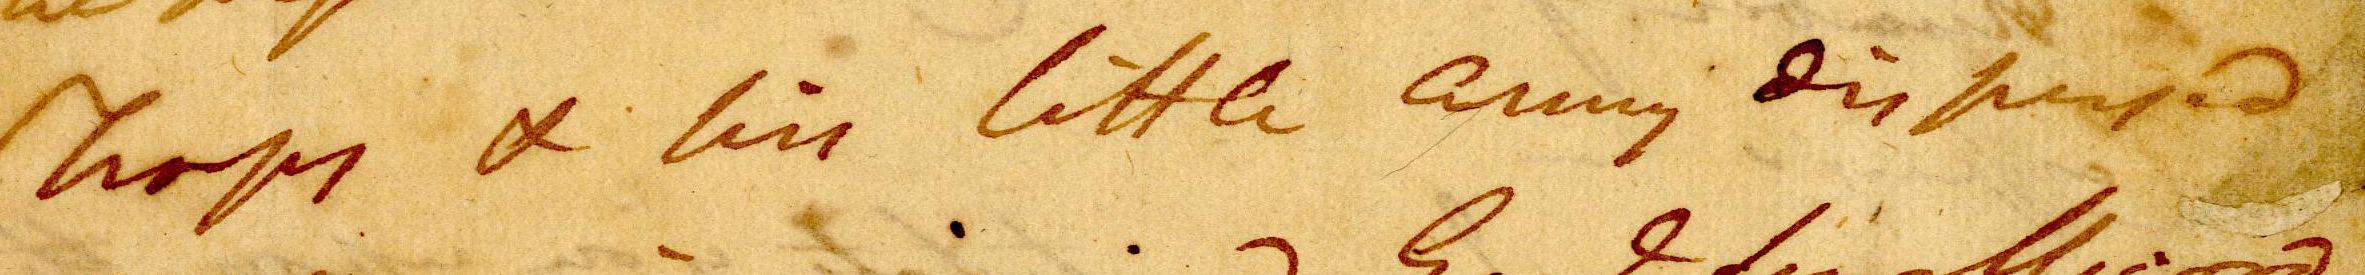Troops & his little army dispersed
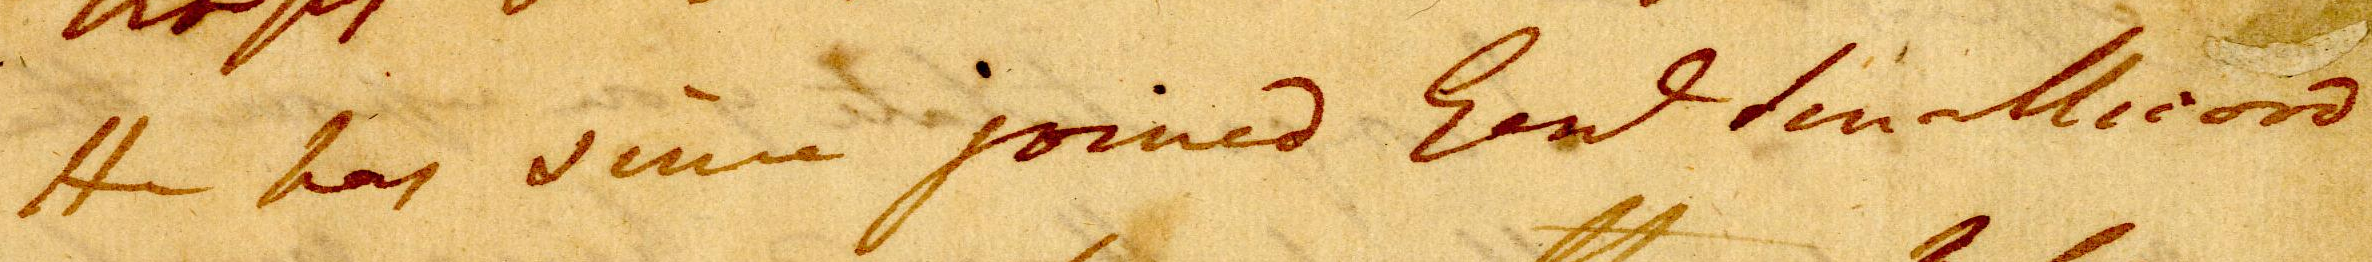He has since joined Gen^l Smallwood
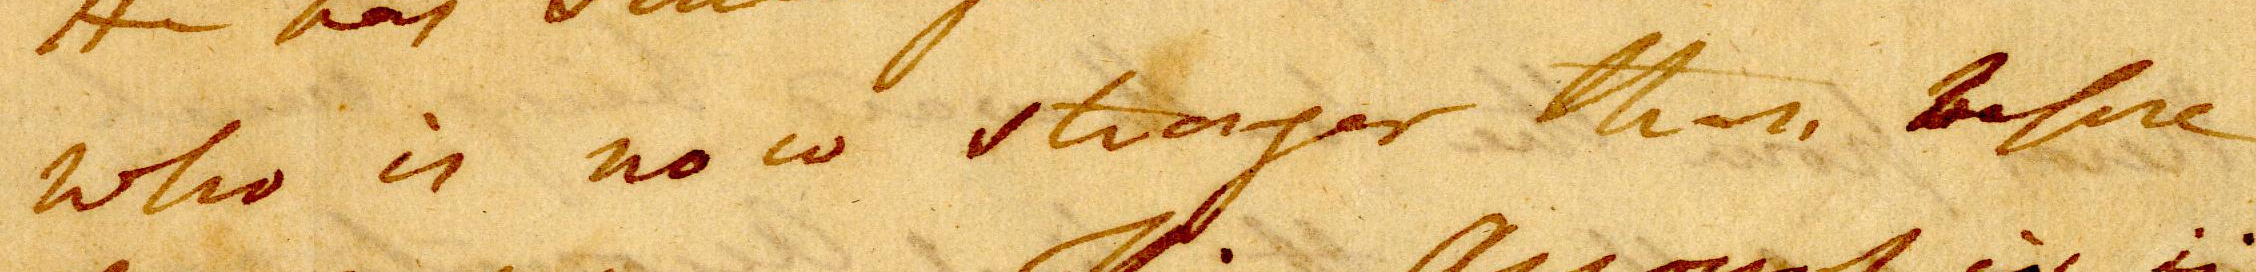who is now stranger than before
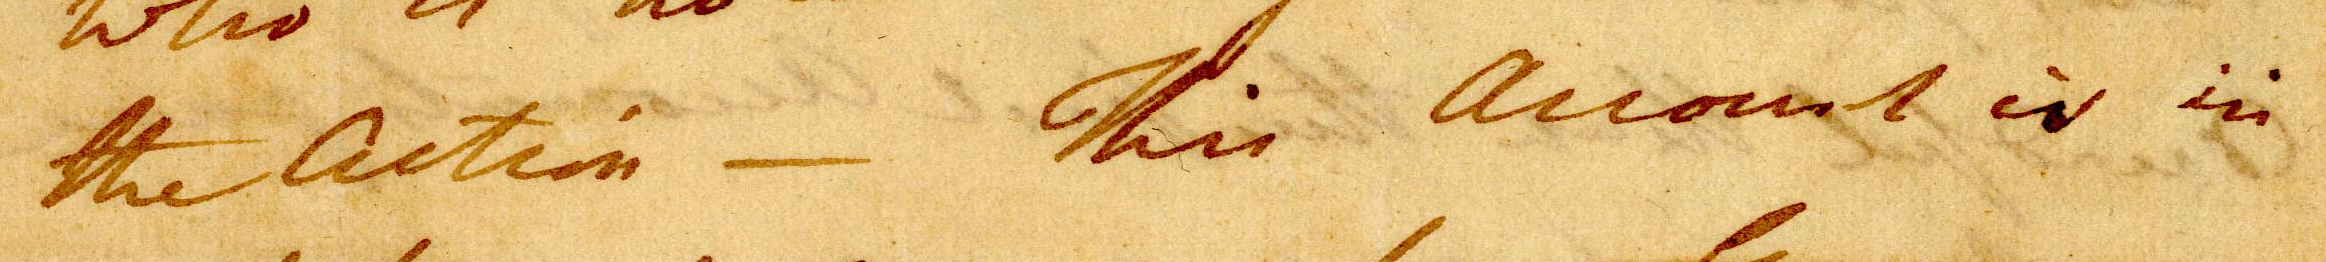the Action. This Account is in
